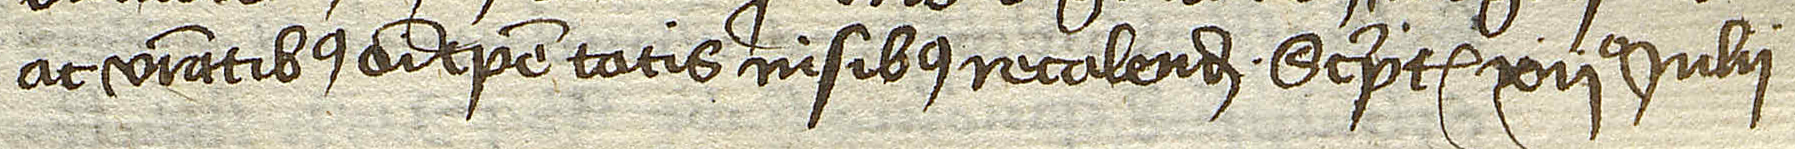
ac v*ratib* o*i t*p*e totis niſib* recolend* . Sc*pt* xii* Iulii
